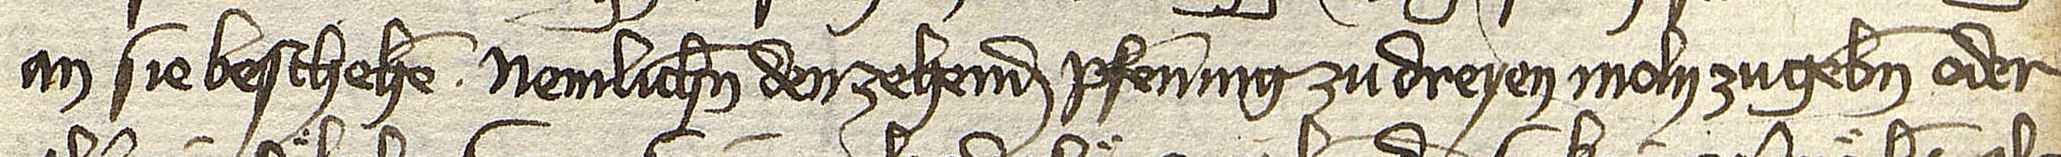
an ſie beſchehe* . Nemlichn* den ʒehend* pfen*ing ʒu dreyen moln ʒu gebn* oder
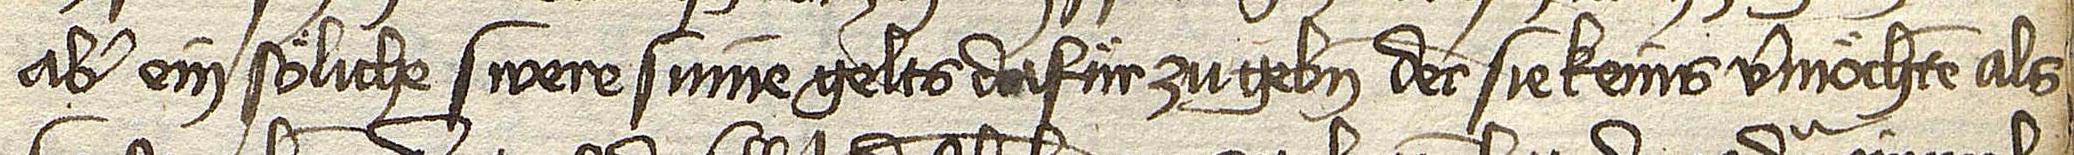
ab* ein ſöliche ſwere ſum*e gelts dafür ʒu gebn* der ſie keins v*möchte* als
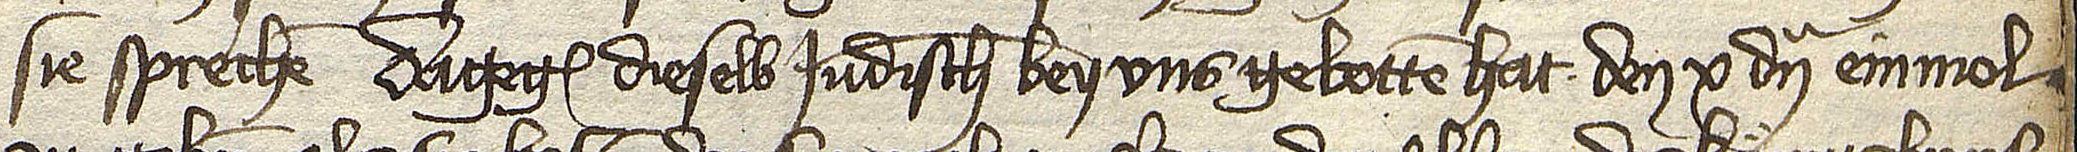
ſie ſpreche* Dageg* dieſelb Iudiſch* bey vns gebotte* hat . den x dn* einmol
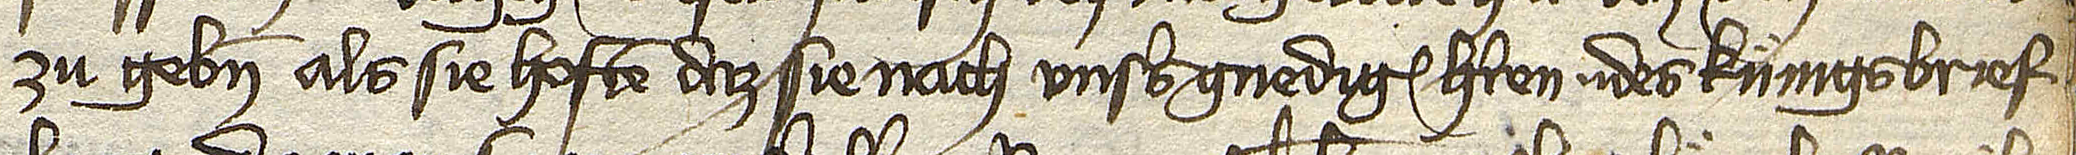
ʒu gebn* als ſie hofte* daʒ ſie nach vnſ*s gnedig* h*ren ~ des künigs brief
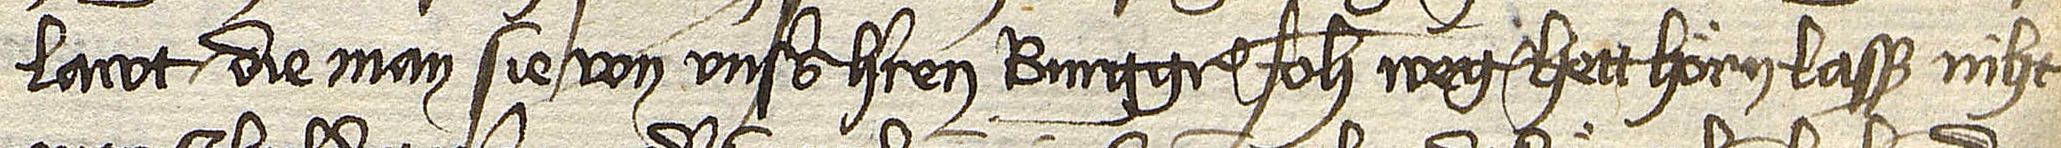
lawt / die man ſie von vnſ*s h*ren Burggr* Ioh* weg* hett hörn laſſ* niht
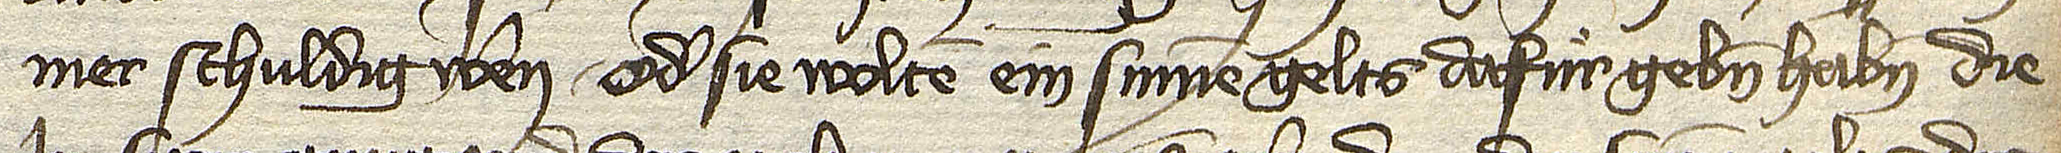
mer ſchuldig w*en / Od* ſie wolte* ein ſum*e gelts dafür gebn* habn* die
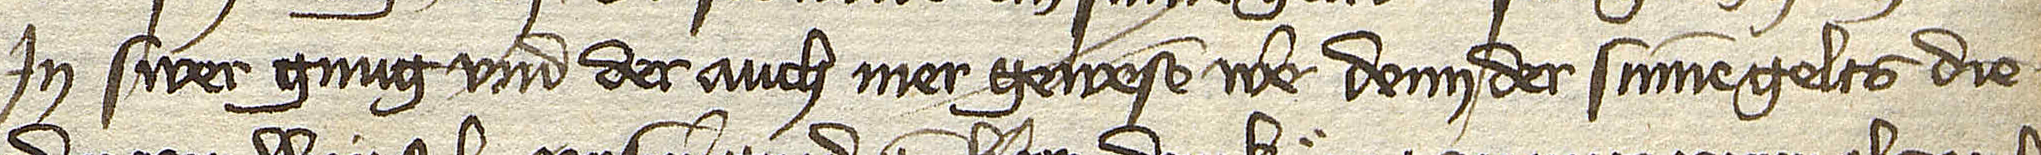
In ſwer gnug vnd der auch mer geweſe* w*e denn der ſum*e gelts die
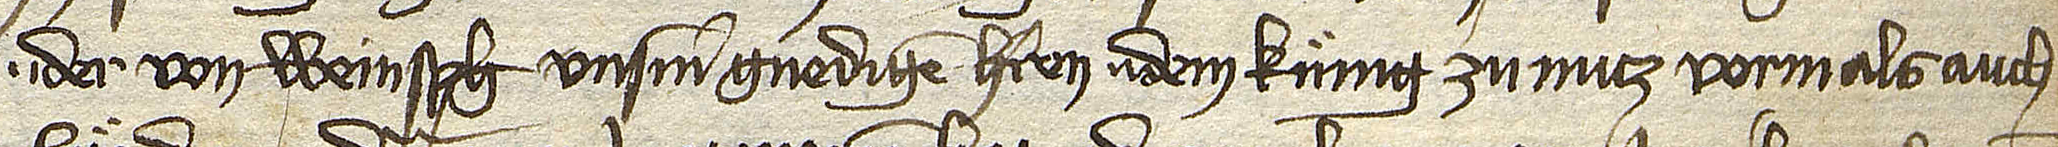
~ der von Weinſp*g vnſm* gnedige* h*ren ~ dem künig ʒu nucʒ vormals auch
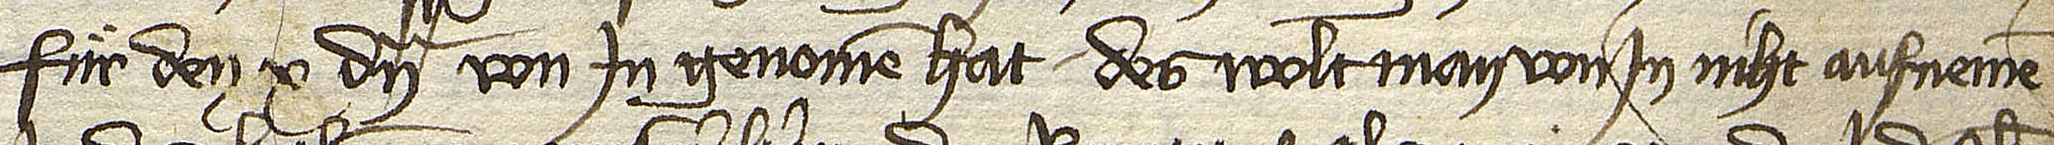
für den x dn*von In genome* hat / des wolt man von In niht aufneme*
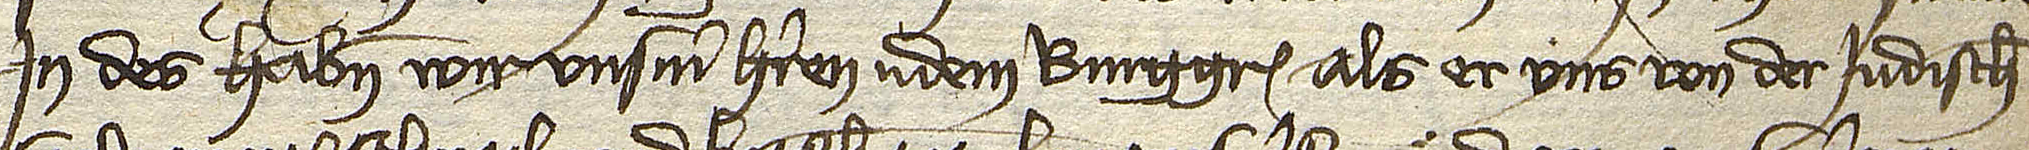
In des habn* wir vnſm* h*ren ~ dem Burggr* / als er vns von der Iudiſch*
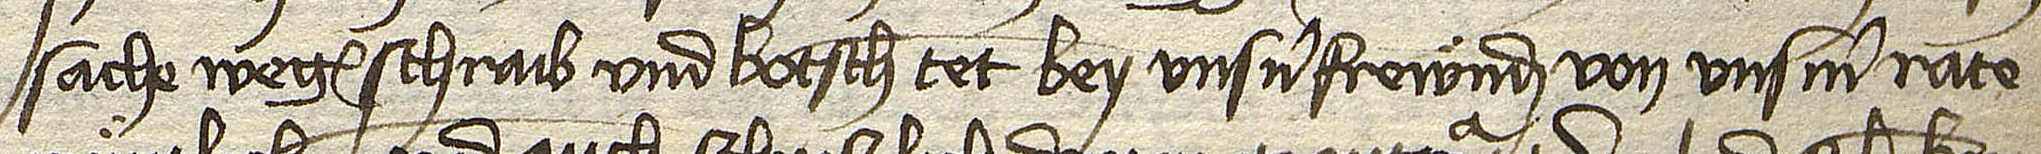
ſache weg* ſchraib vnd botſch* tet bey vnſn* freẅnd* von vnſm* rate
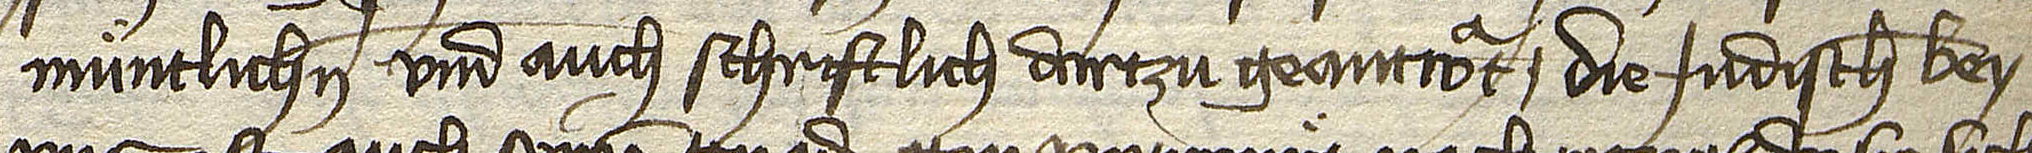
müntlichn* vnd auch ſchriftlich darcʒu geantw*t / die Iudiſch* bey
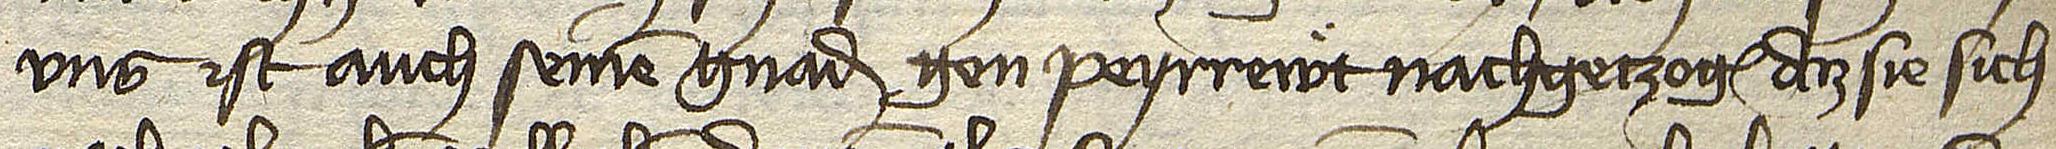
vns iſt auch ſeine* gnad* gen Peyrreẅt nachgecʒog* daʒ ſie ſich
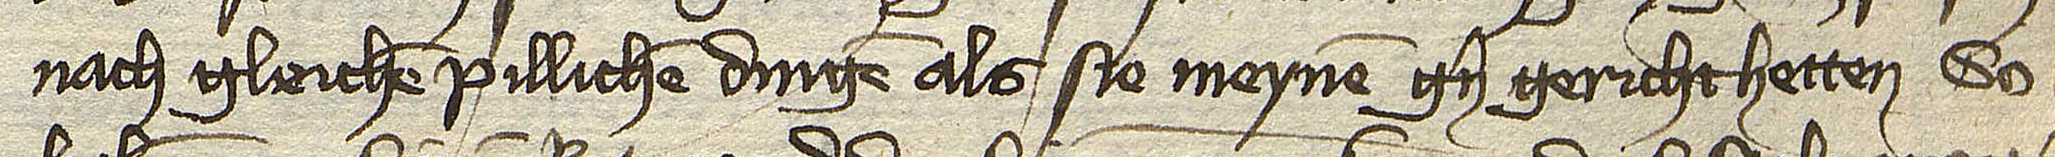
nach gleiche* pilliche* dinge* als ſie meyne* g*n gericht hetten So
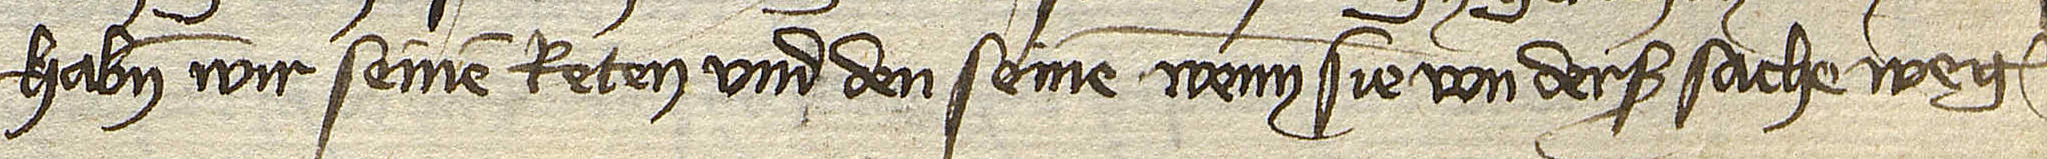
habn* wir ſeine* Reten vnd den ſeine* wenn ſie von derſ* ſache weg*
